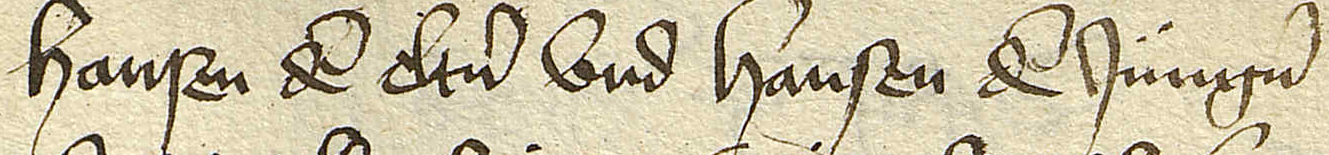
Hanſen d* eltn* vnd Hanſen d* Iüngn*
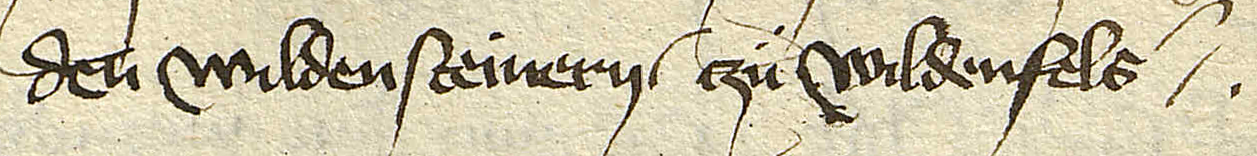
den wildenſteinern / cʒü wildenfels / .
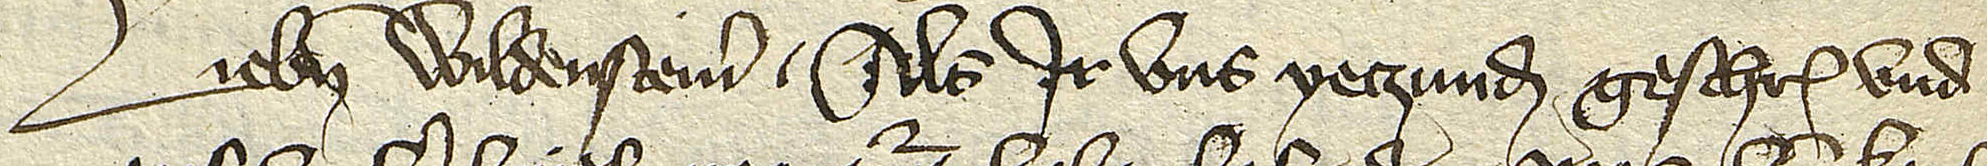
Liebn* Wildenſtein* / Als Ir vns yecʒund* geſchr* vnd
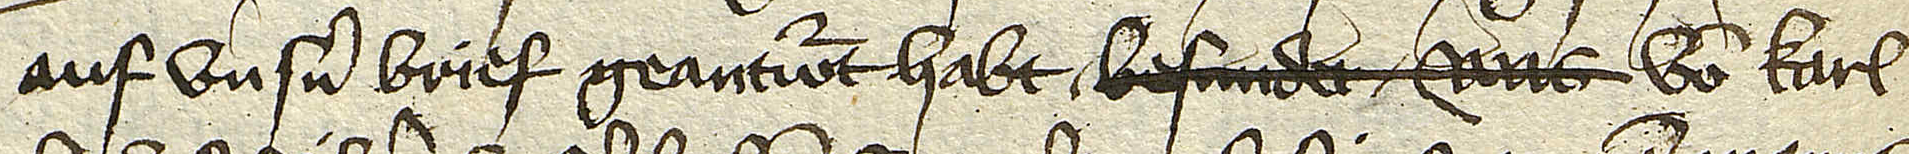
auf vnſn* brief geantwt* habt / beſunder / was vo* karl
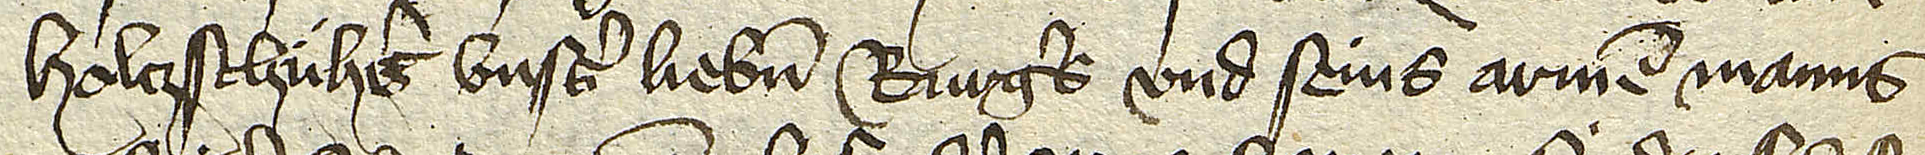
holcʒſchühs* vnſs* liebn* Burg*s vnd ſeins arme* manns
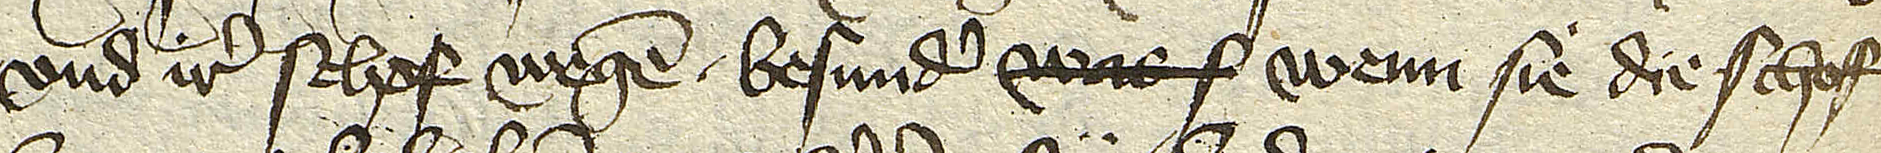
vnd ir* ſchof wege* / beſund* was ſ wenn ſie die ſchof
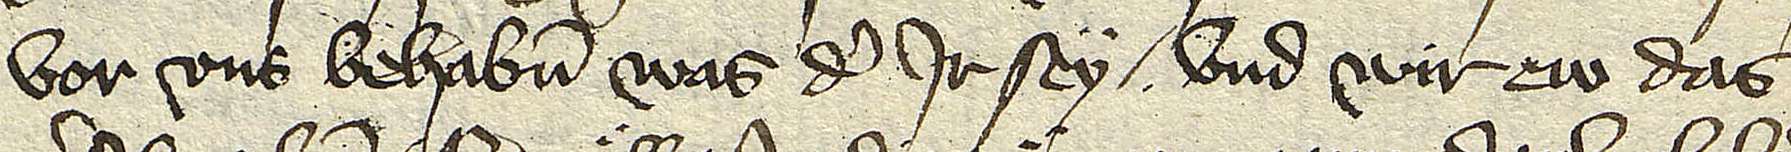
vor vns behabn* was d* Ir ſey / . vnd wir ew das
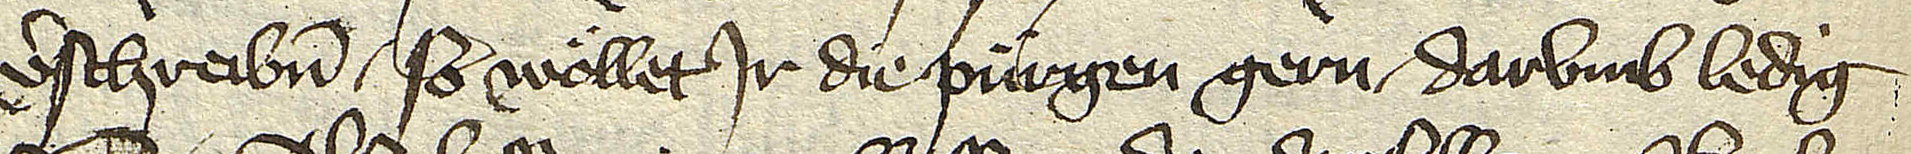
v*ſchreibn* / ſo wöllet Ir die pürgen gern / darvmb ledig
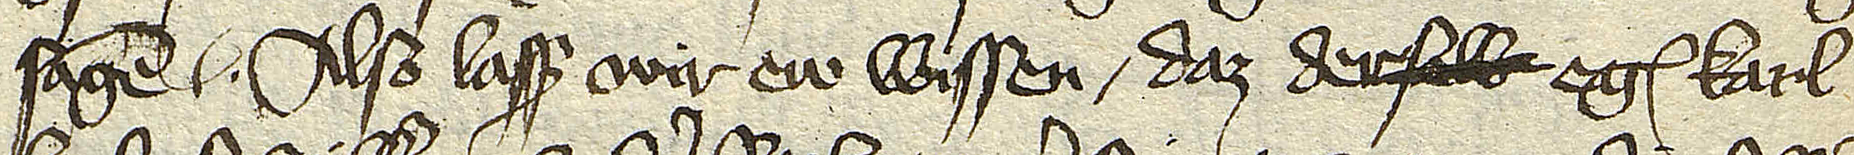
ſage* / . Alſo laſſ* wir ew wiſſen / daʒ derſelb eg* karl
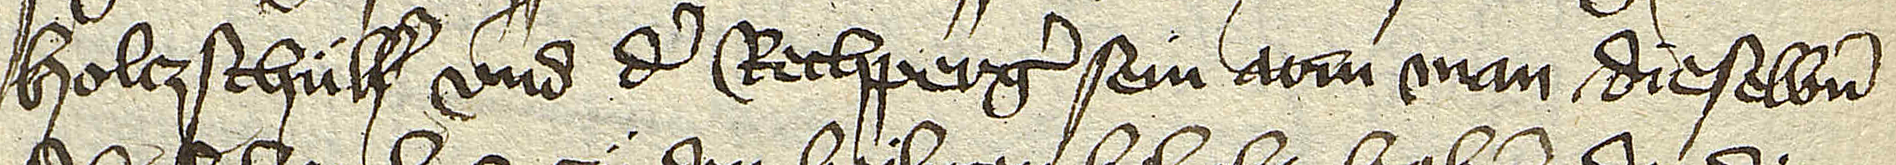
holcʒſchüh* vnd d* Rechperg* ſein arm man / dieſelbn*
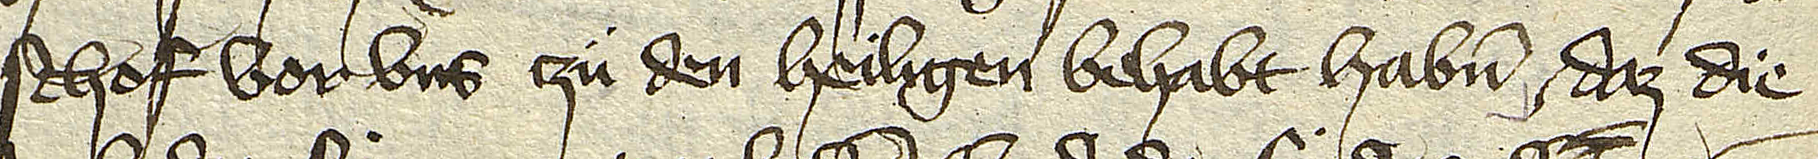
ſchof vor vns cʒü den heiligen behabt habn* / daʒ die
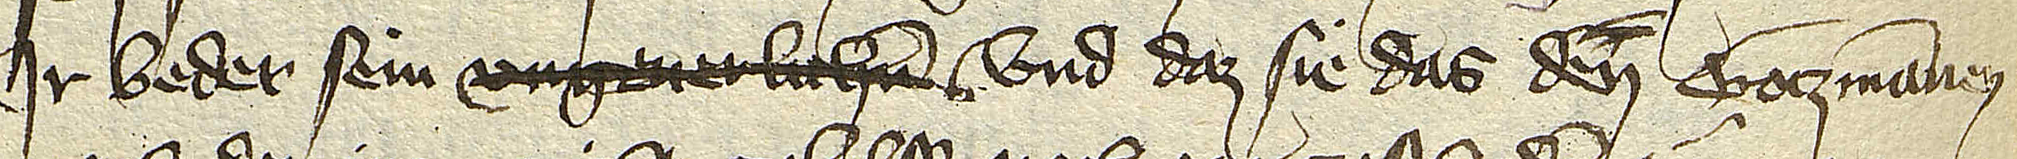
Ir beder ſein vngeuerlichn* / vnd daʒ ſie das den Gocʒma*nen
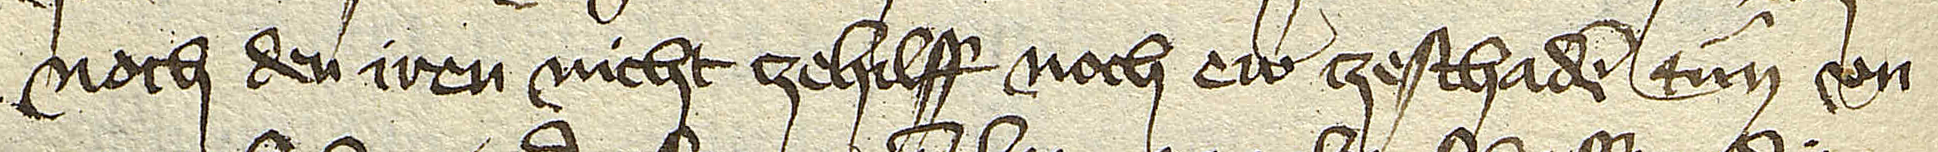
noch den iren nicht cʒehilff noch ew cʒeſchade* tün vn
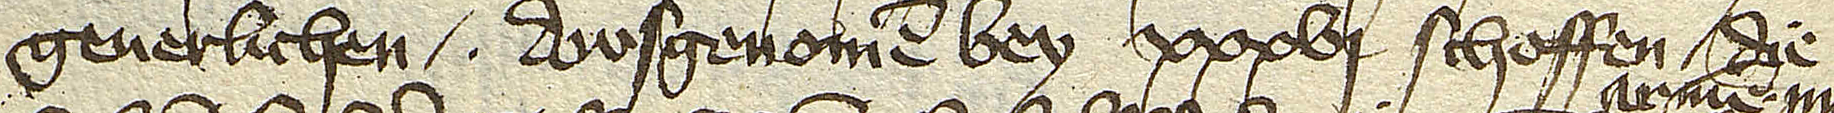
geuerlichen / . Awſgenome* bey xxxvi ſchoffen / die
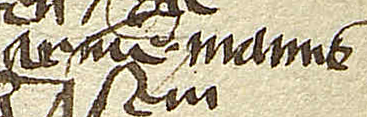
arme*manns
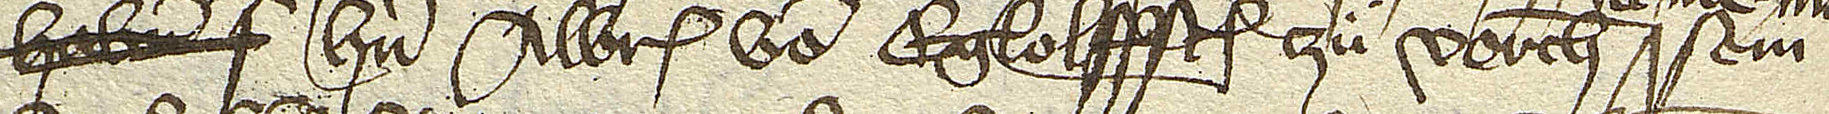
habn* ſ hn* Albr* vo* Eglolffſt* cʒü vorch* ſein
